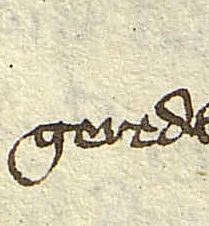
geredt
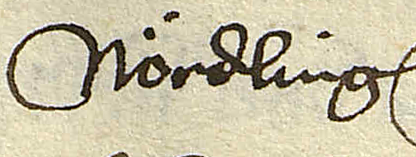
Nördling*
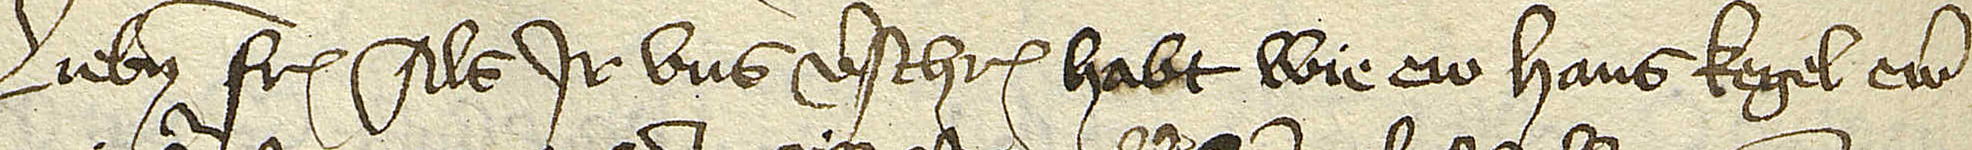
Liebn* fr* Als Ir vns v*ſchr* habt wie ew hans kegel ew*
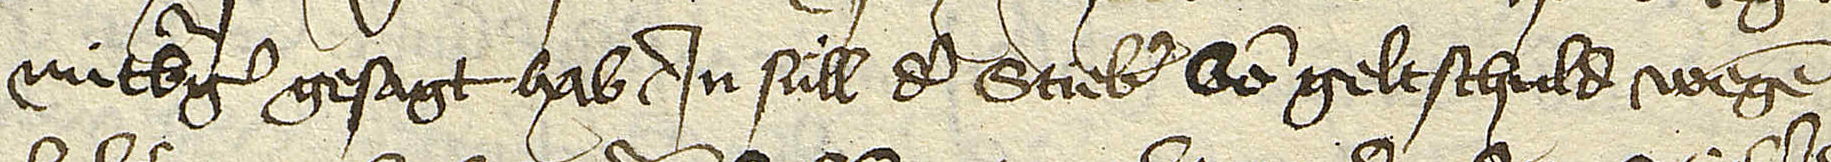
mitb*g geſagt hab / In ſüll d* Stieb* vo* geltſchuld wege*
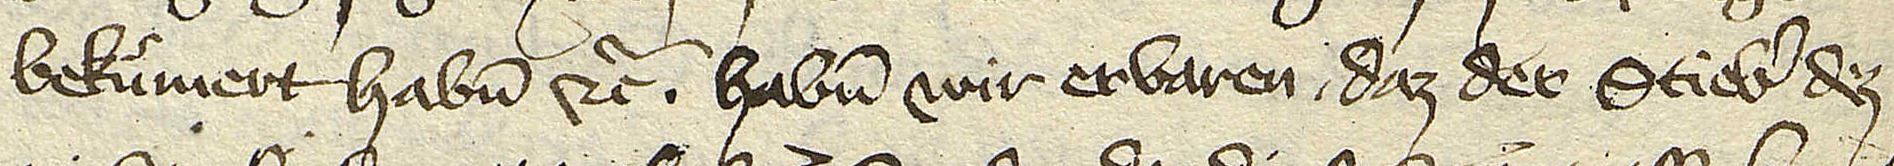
bekümert habn* ec* . habn* wir ervaren / daʒ der Stieb* deʒ
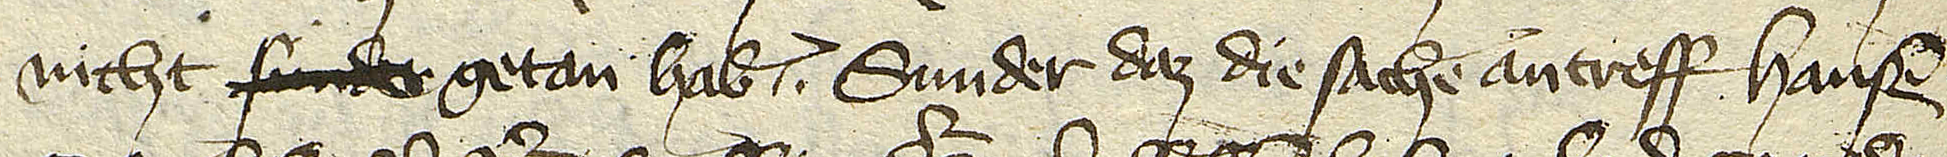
nicht ſünder getan hab / . Sunder daʒ die ſache antreff Hanſe*
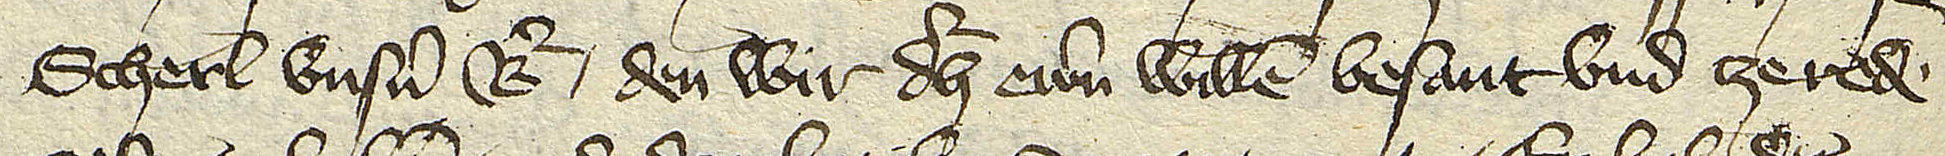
Scherl vnſn* B* / den wir d*h ew*n wille* beſant vnd cʒerede
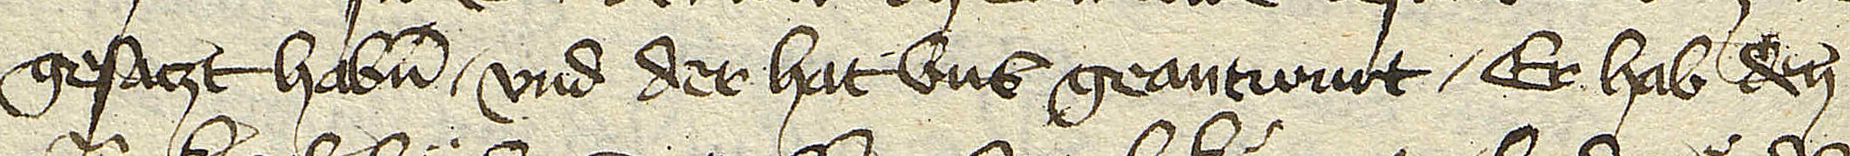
geſacʒt habn* / vnd der hat vns geantwurt / Er hab den
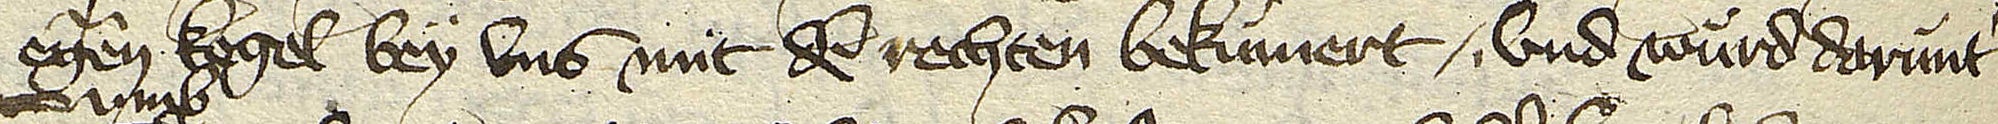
egen* kegel bey vns mit d* rechten bekümert / . vnd würd darunt*
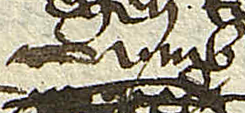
% vmb
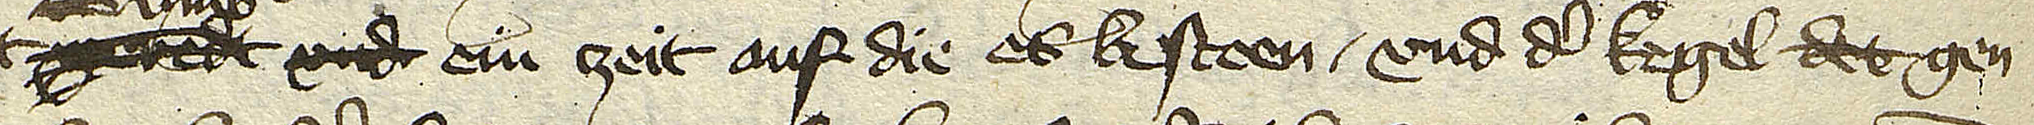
geredt vnd ein cʒeit auf die es beſteen / vnd d* kegel der gen
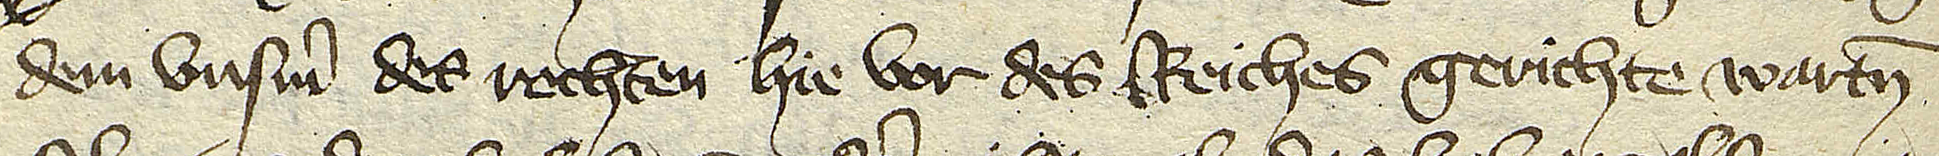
dem vnſm* des rechten hie vor des Reiches gerichte wartn*
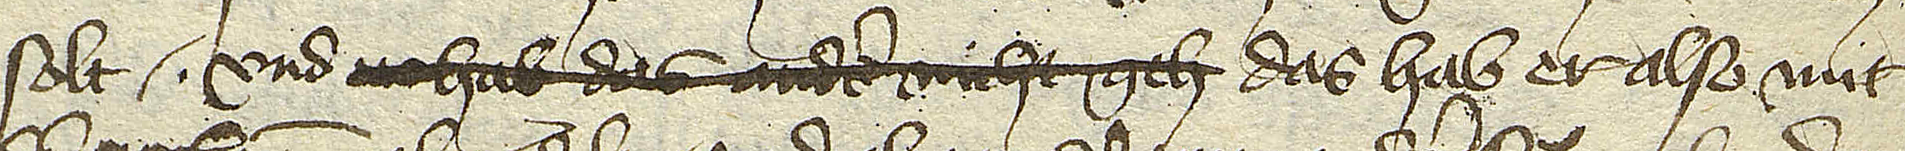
ſolt / . vnd er hab das ands* nicht geh das hab er alſo mit
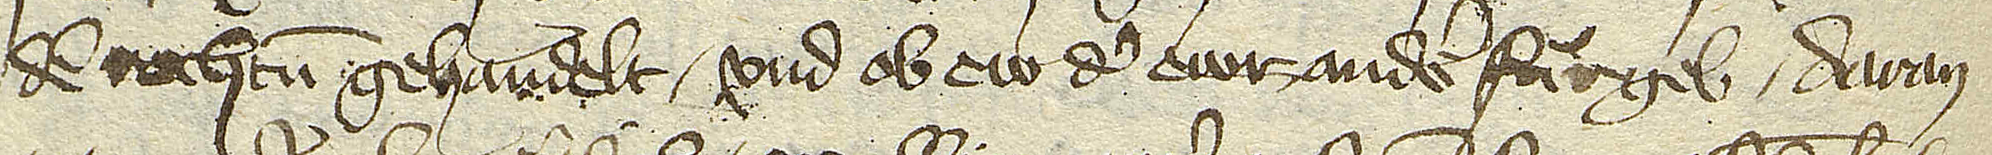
d* nechtn* gehandelt / vnd ob ew d* ewr ands* fürgeb / daran
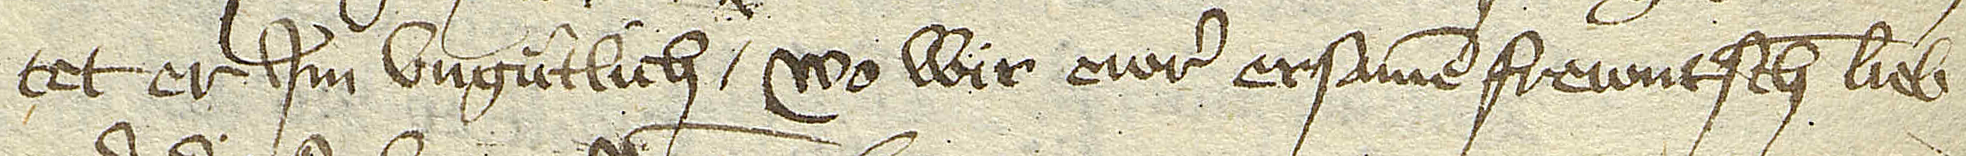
tet er Im vngütlich / wo wir ewr* erſame* frewntſch* lieb
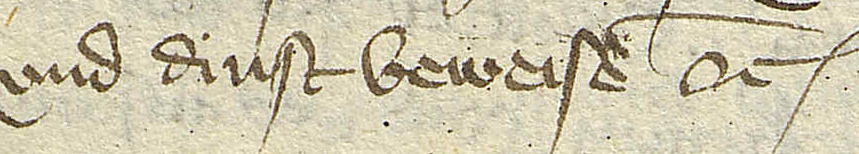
vnd dinſt beweiſe* ec*
